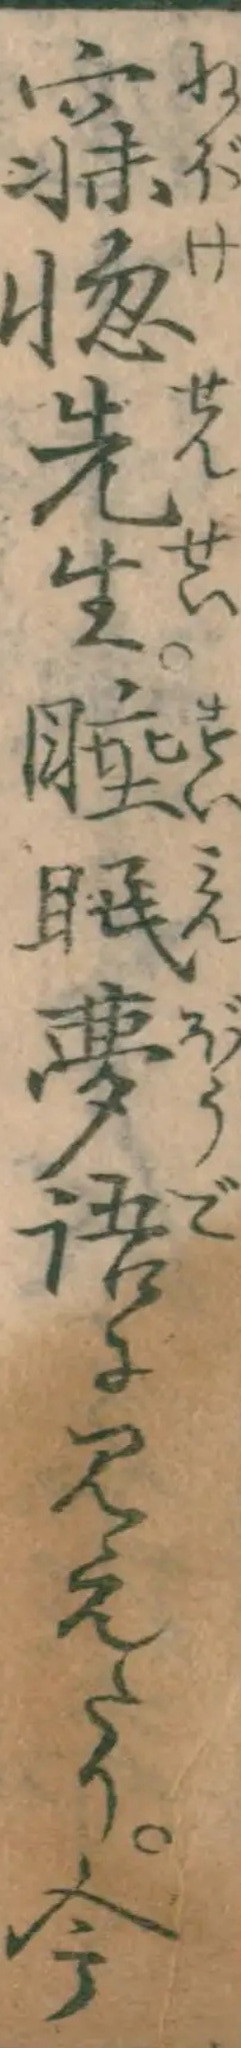寝惚先生。睡眠夢語に見えたり。今
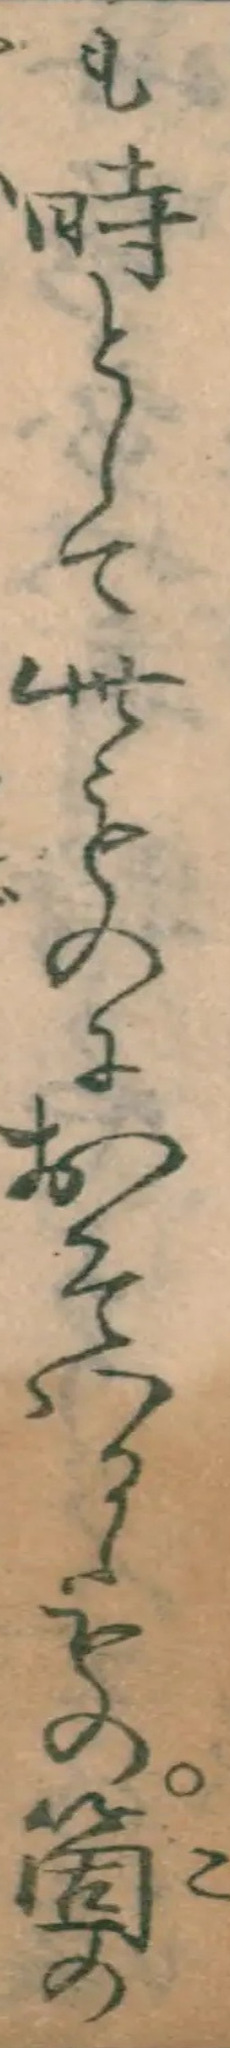も時として此ものにおそはるゝもの。箇の
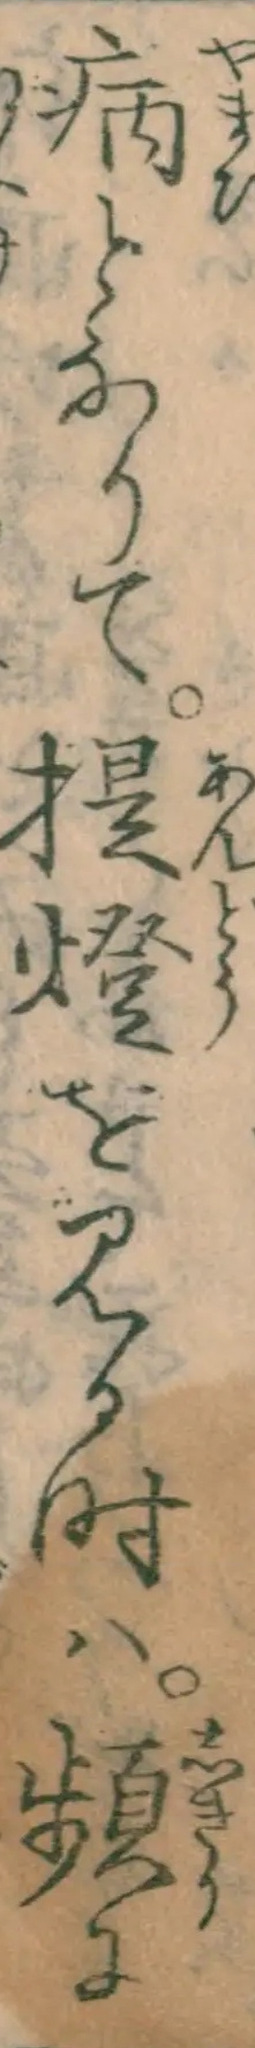病となりて。提燈を見る時は。頻に
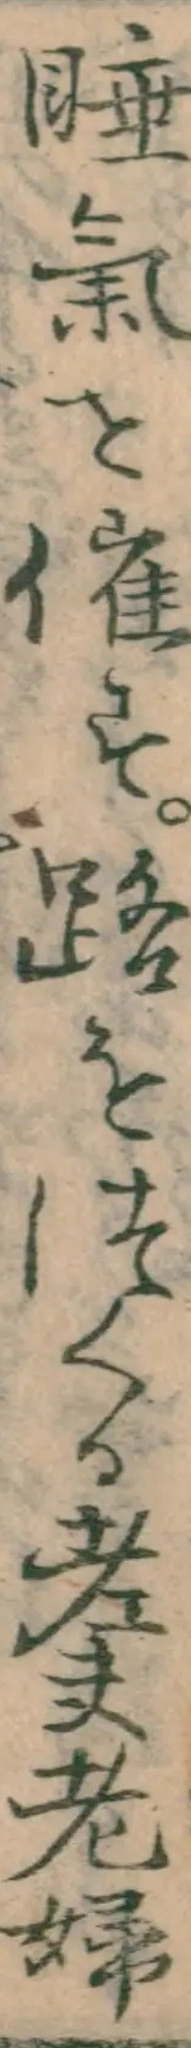睡気を催す。路をつくる老夫老婦
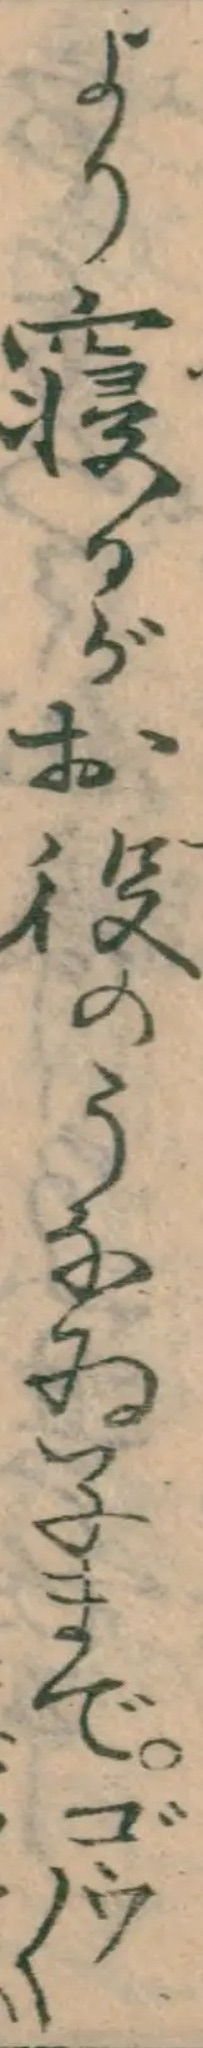より寝るがお役のうなゐ子まで。ゴウ〳〵
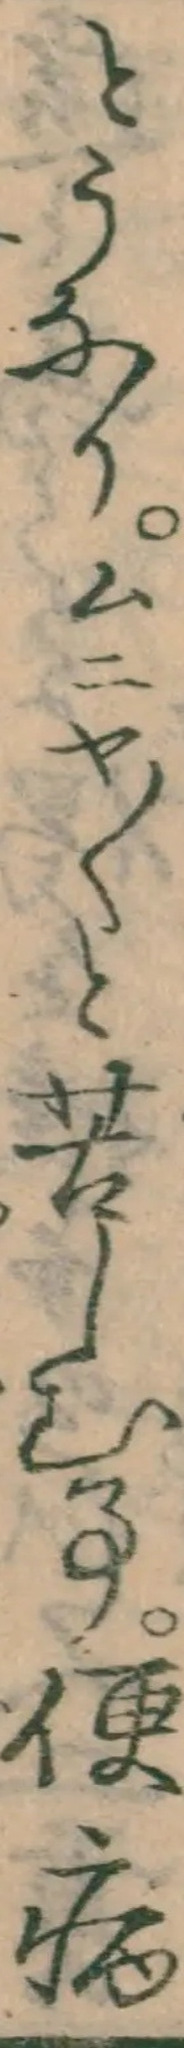とうなり。ムニヤ〳〵と苦しむ事。便病
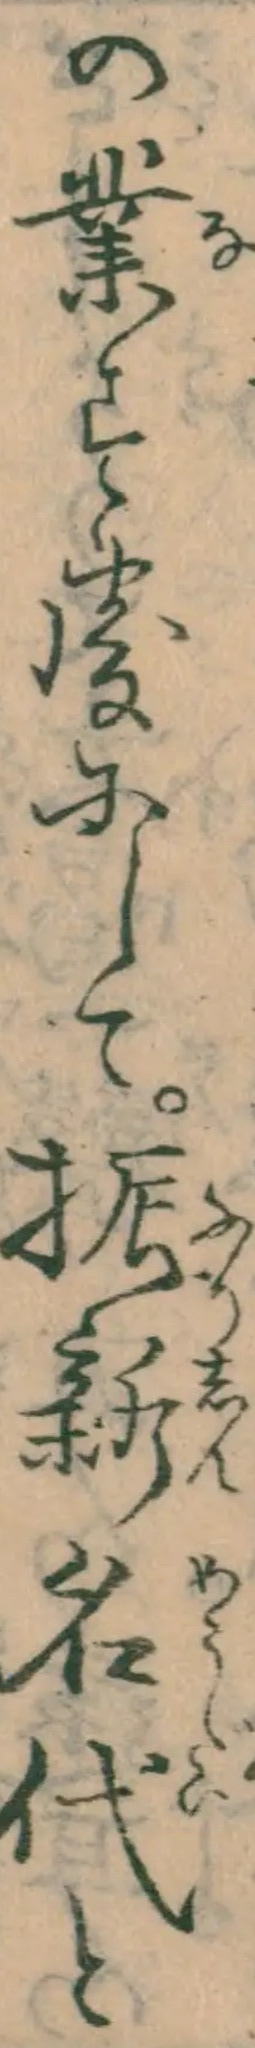の業す処にして。振新名代と
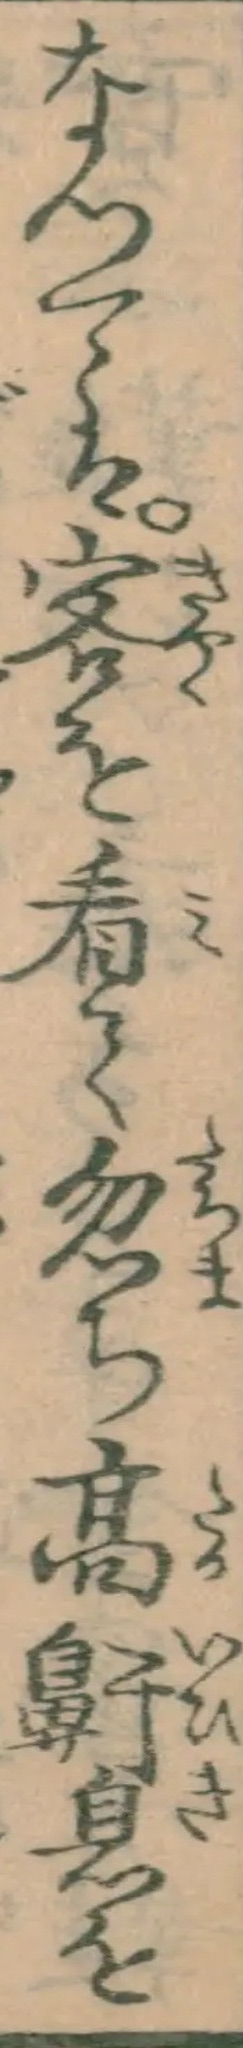なつては。客を看て忽ち高鼾息を
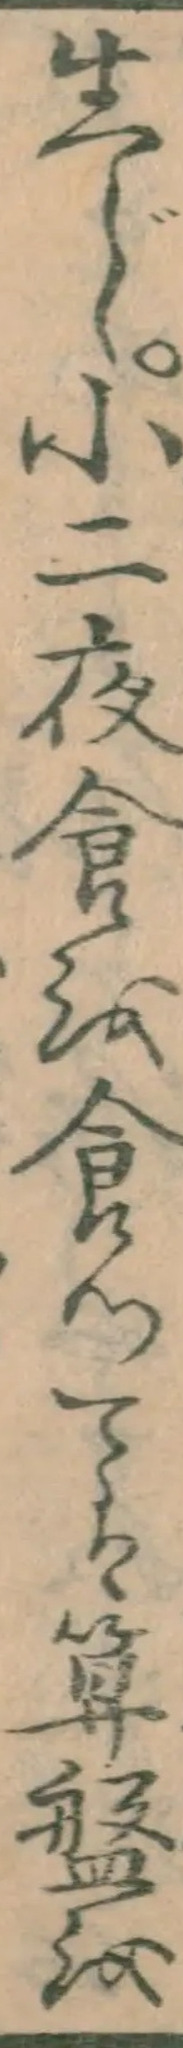生じ。小二夜食を食つては算盤を
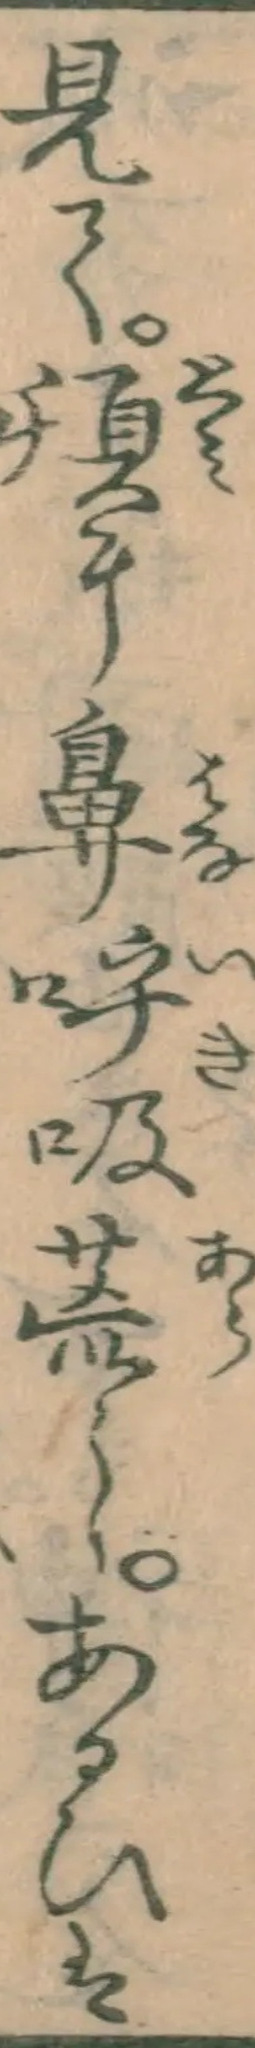見て。頓に鼻呼吸荒し。あるひは
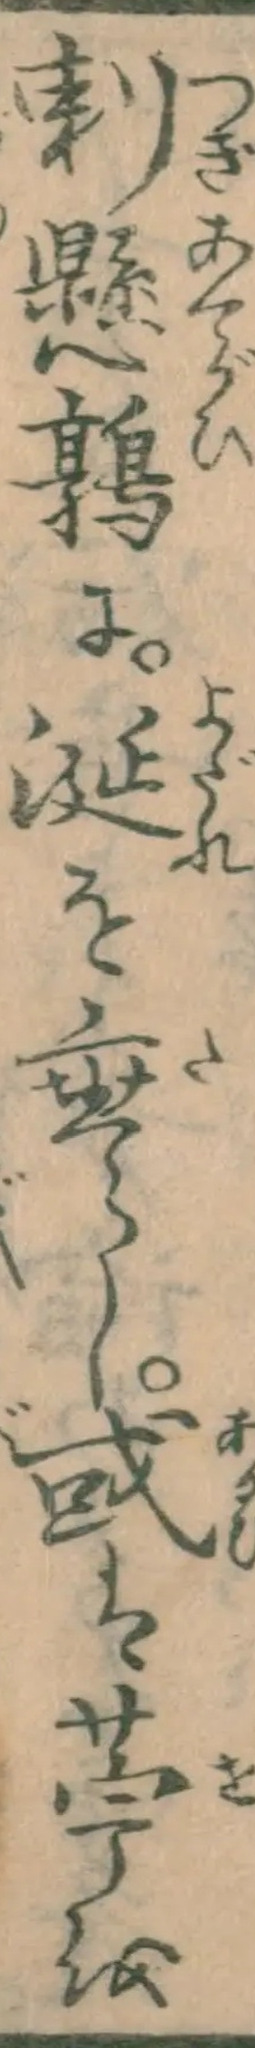刺懸鶉に。涎を垂らし。或は苧を
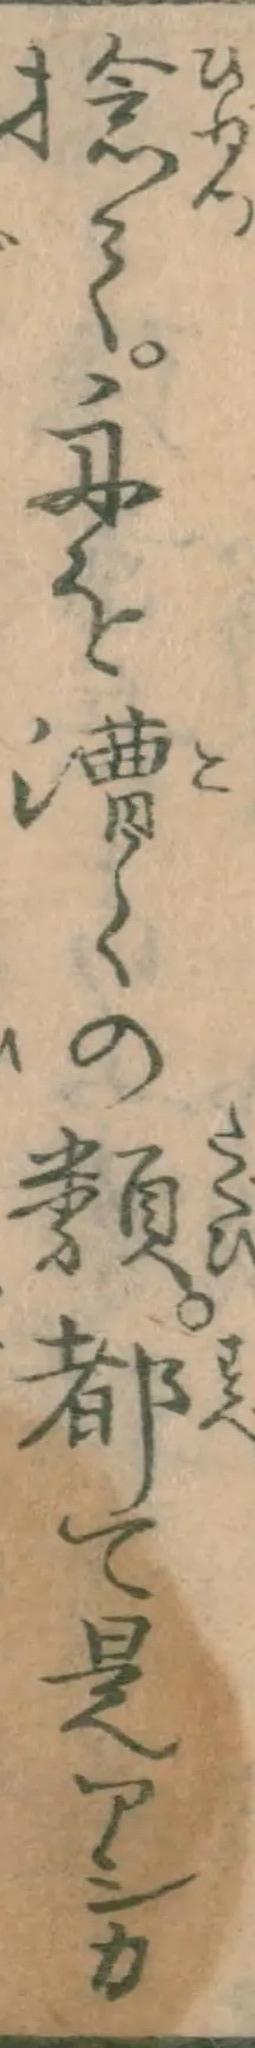捻て。舟を漕くの類。都て是アシカ
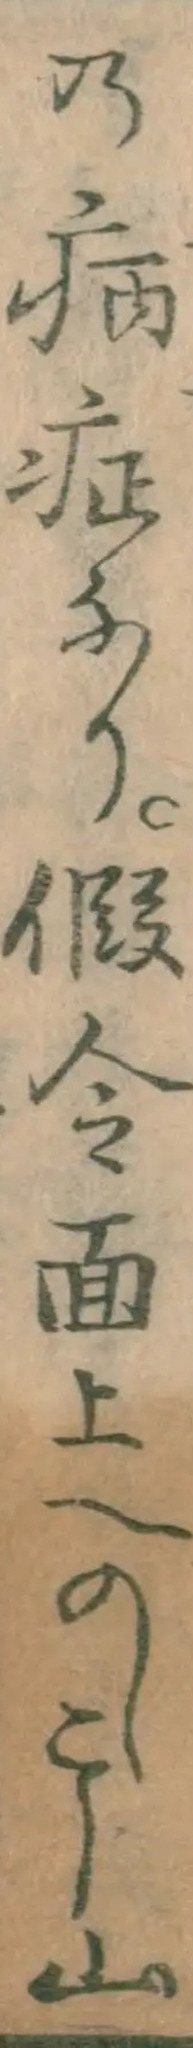の病症なり。仮令面上へのしこし山
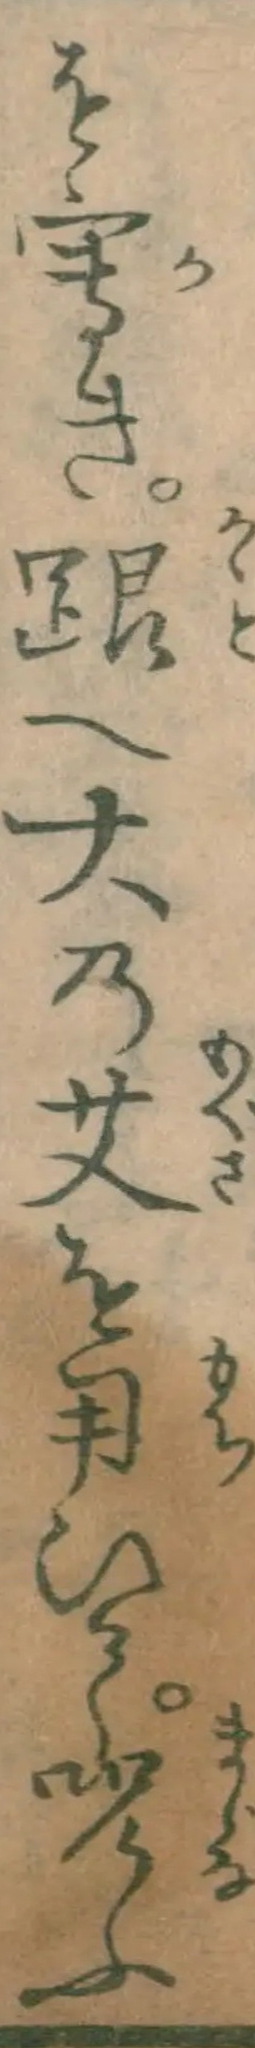を写き。踉へ大の艾を用ひて。呪ふ

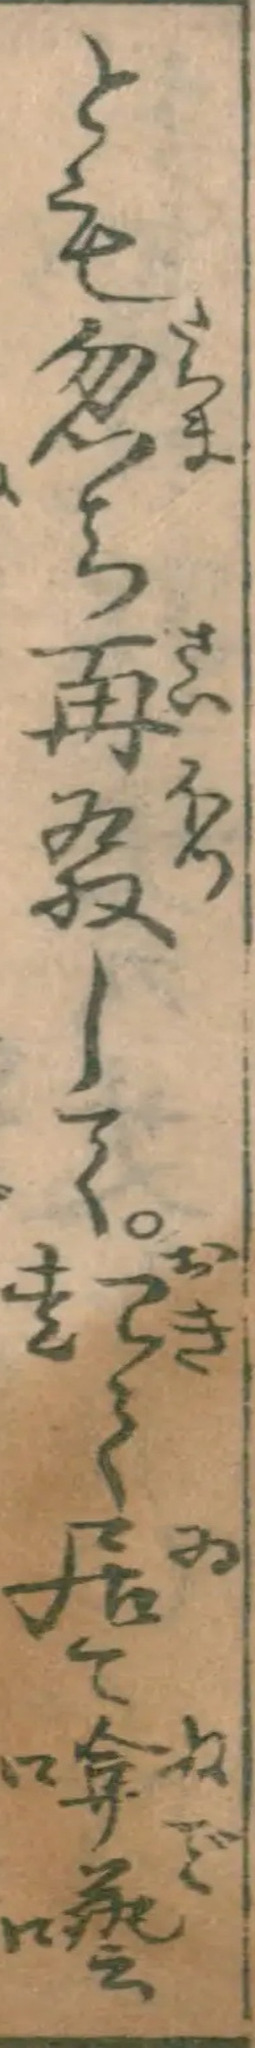とも忽ち再発して。起て居て啽囈
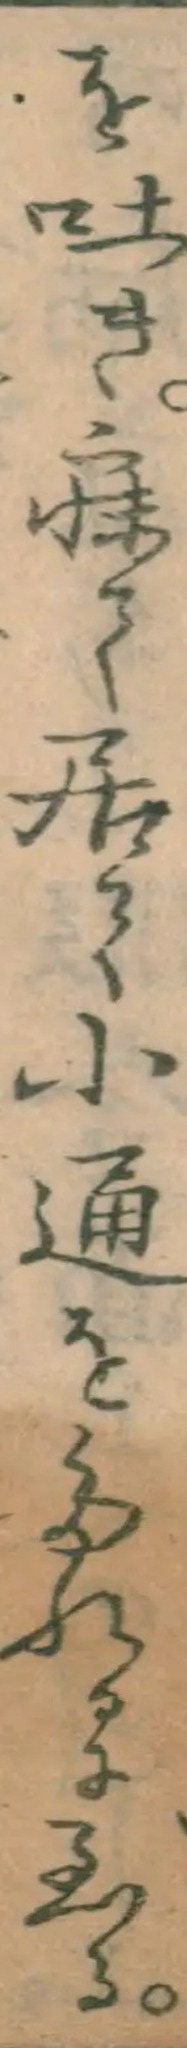を吐き。寝て居て小通をたれるに至る。
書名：麻疹戯言
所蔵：国立国会図書館 National Diet Library, JAPAN
